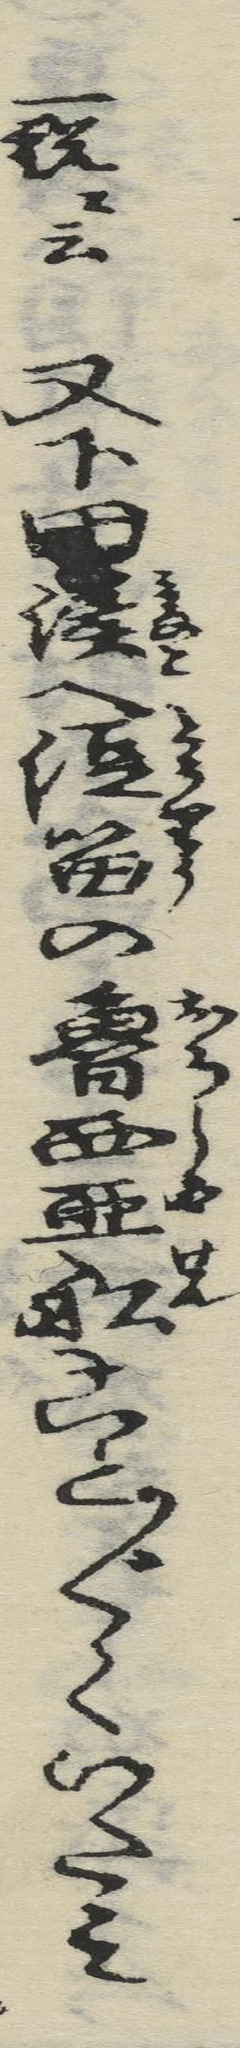一説ニ言又下田湊へ逗留の魯西亜船ことごとくいたみ
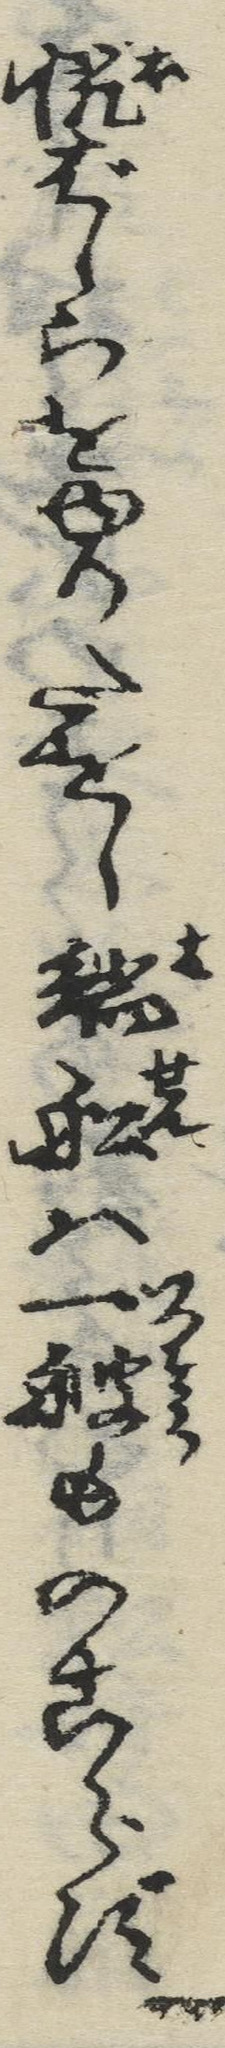帆ばしらをゆりたをし端船は一艘ものこらず
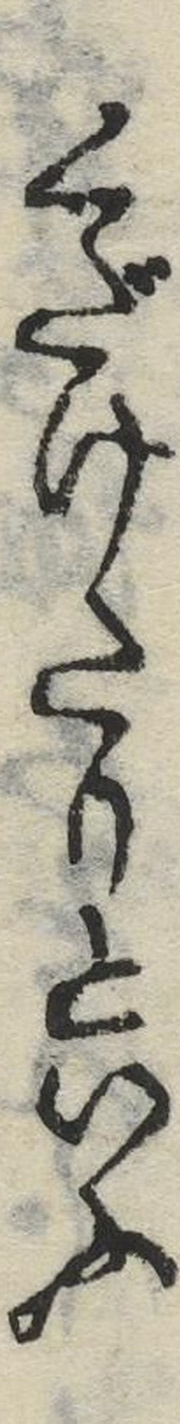くだけたりといふ
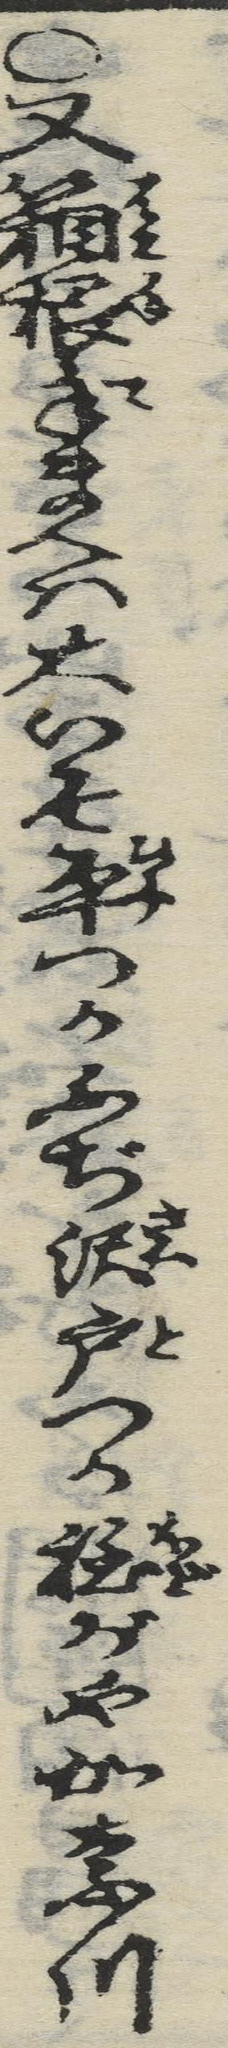○箱根手まへは大いそ平つかふぢ沢戸つか程がやかな川
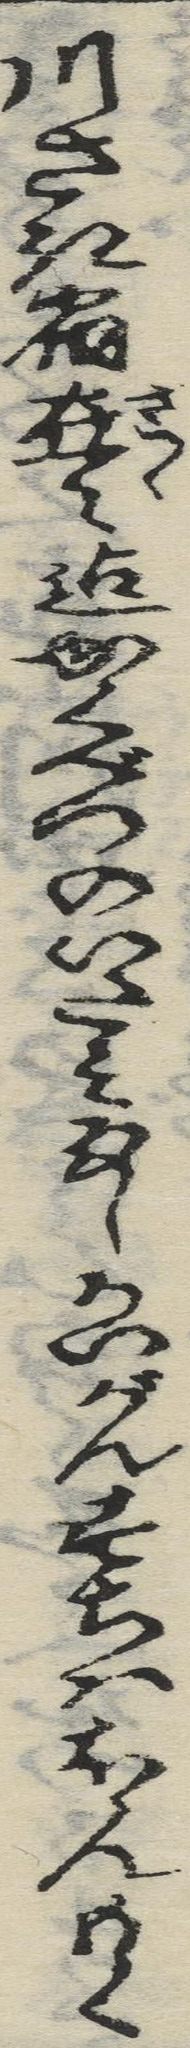川さき宿在々迄かくべつのいたみなしかいがんすぢはほんもく
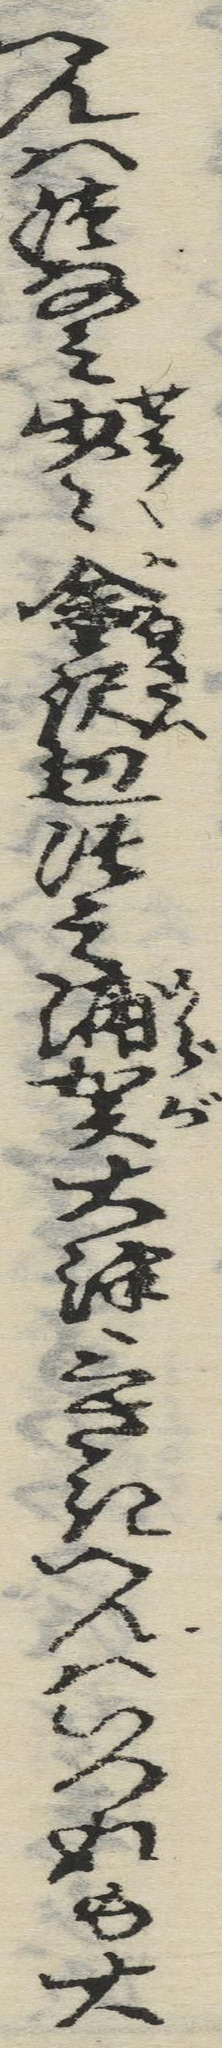へんはつなみ少々金沢辺つみ浦賀大津三さきへんはいつれも大
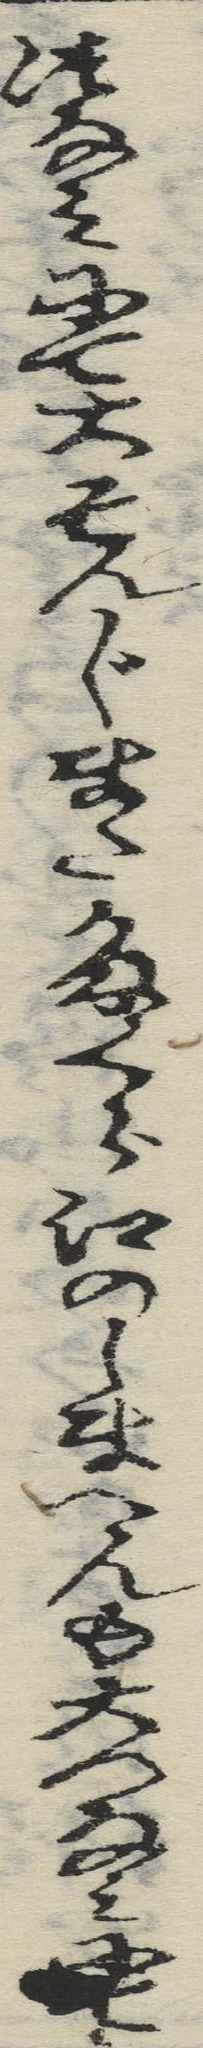つなみにて大そんじまたかまくら江のしまへんも大つなみ
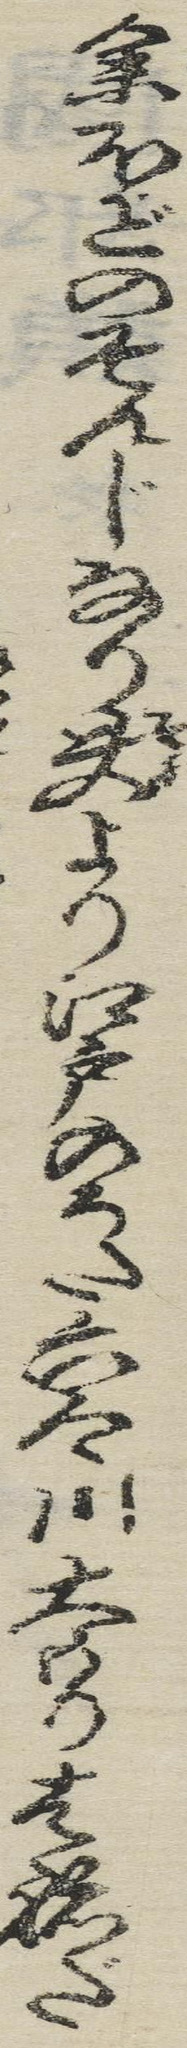余ほどのそんじなり夫より江戸のかた六郷川大もりはねだ
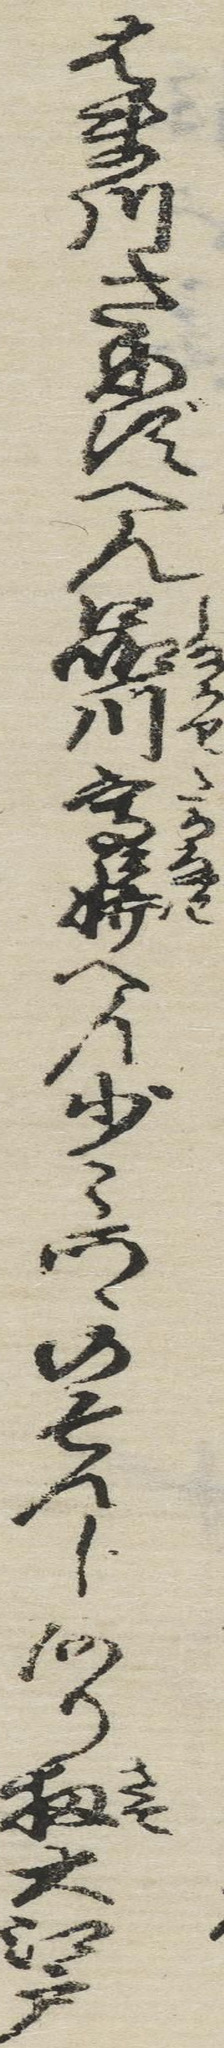はま川さめずへん品川高輪へん少々つゝのそんじあり扨大江戸
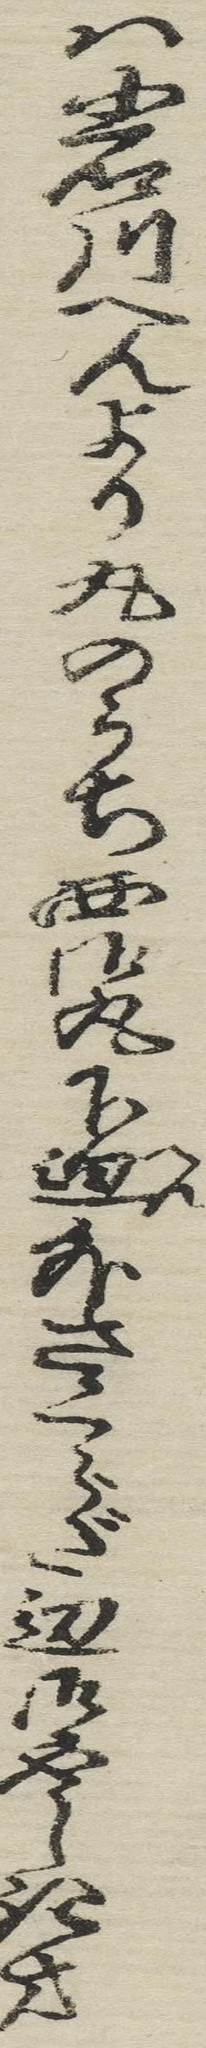は小石川へんより丸のうち西御丸下辺外さくらだ辺御やしき方
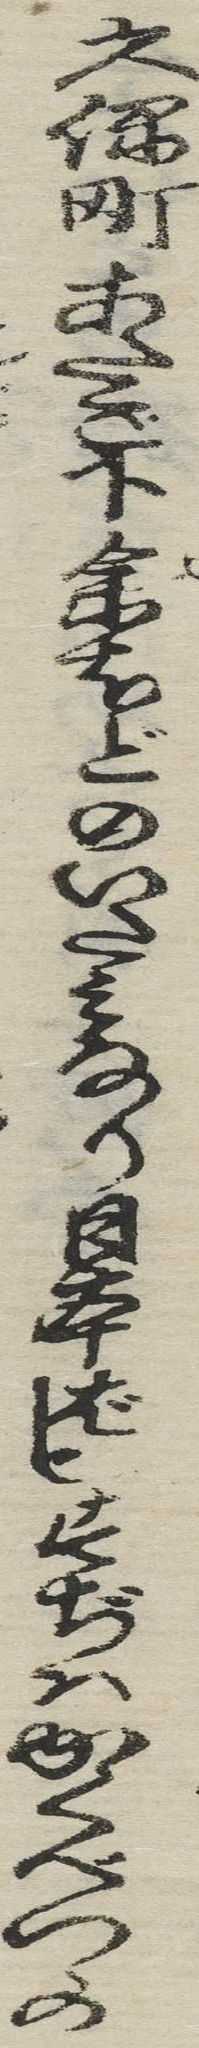久保町あたご下余ほどのいたみなり日本ばしすぢはかくべつの
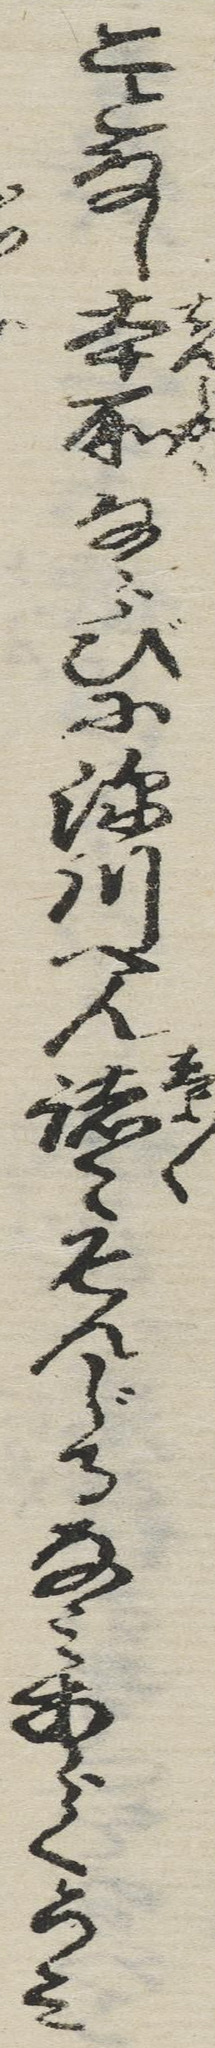ことなし本所ならびに深川へん諸々そんじるなみあらくうみ
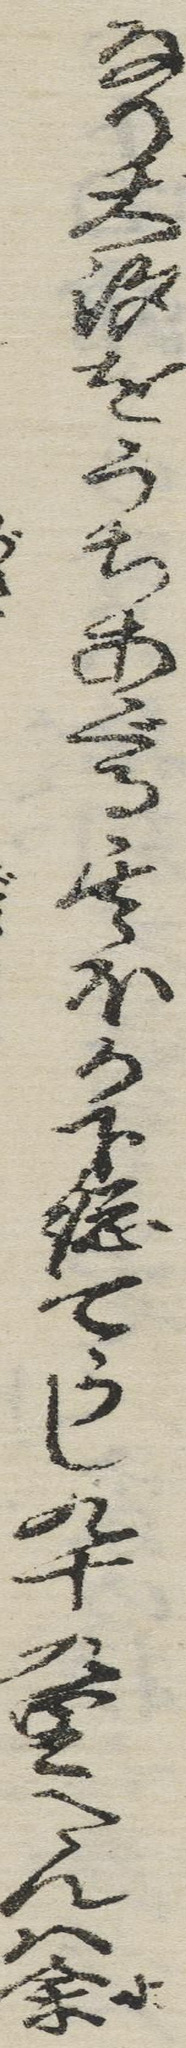なり大汐をうちあぐる其ほか下総てうし九十九里えんは余
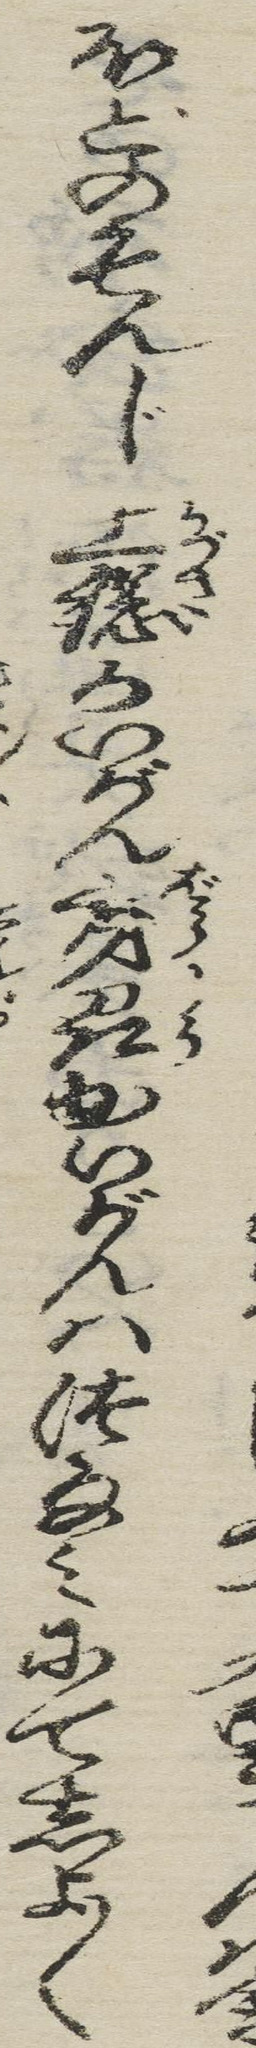ほどのそんじ上総かいがん房州かいがんはつなみにてしょ
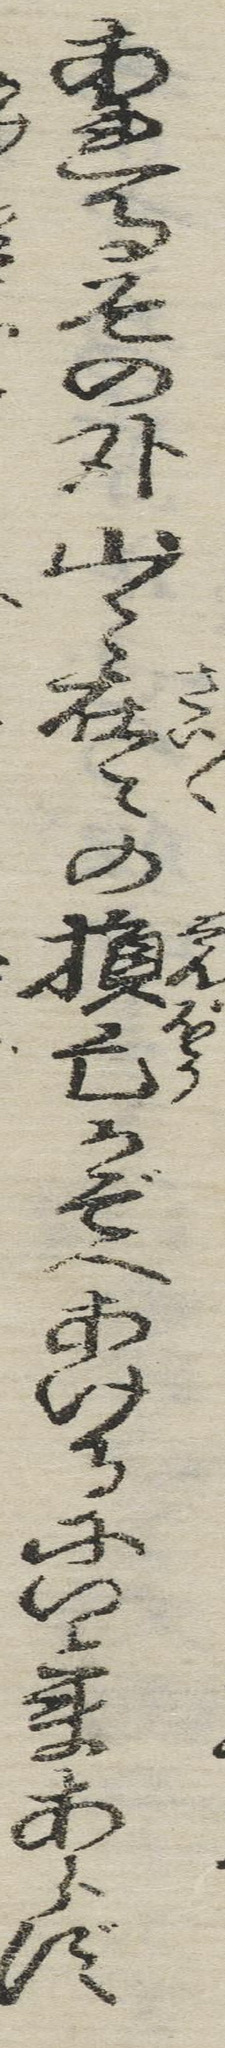あれるその外山々在々に損亡かぞへあけるにいとまあらず
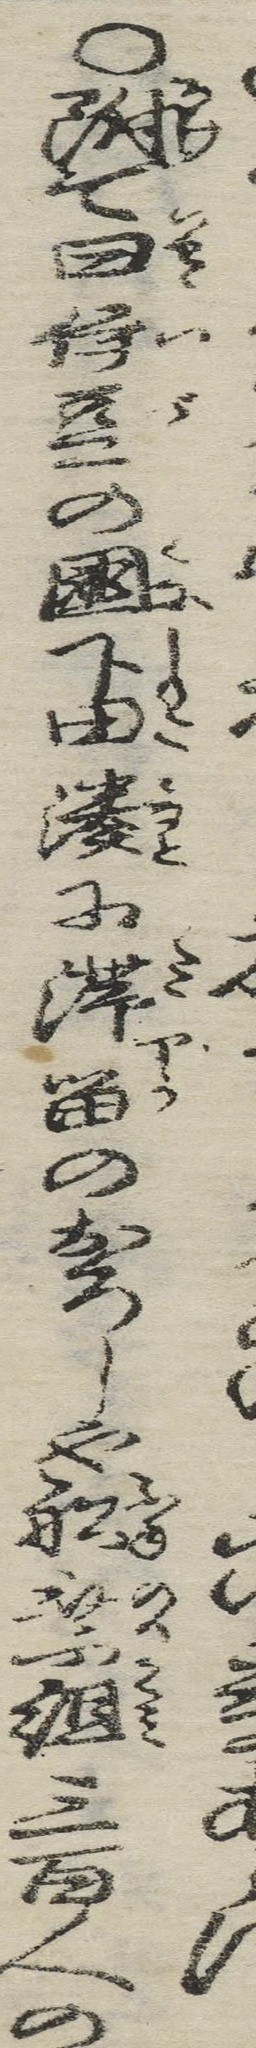○附て曰伊豆の国下田湊に滞留のおろしや船乗組三百人の
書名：諸国海辺地震津波書
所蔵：東京大学地震研究所図書室 Earthquake Research Institute Library, The University of Tokyo, JAPAN
